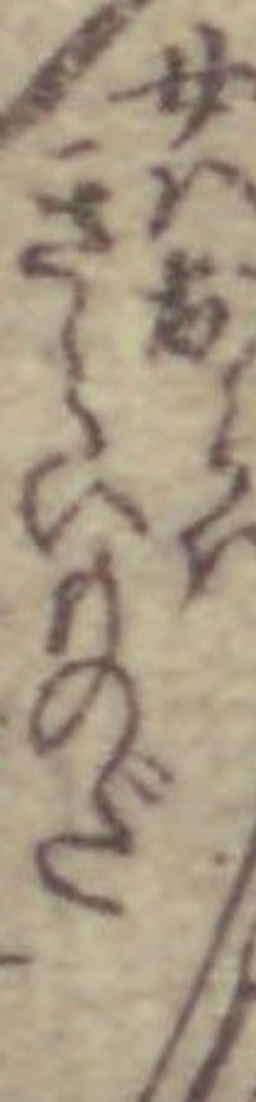きらいものだ
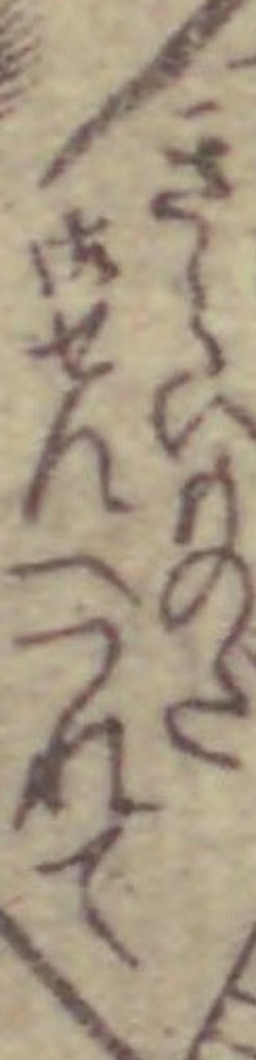御せんへつれて
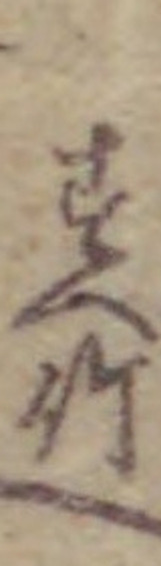すへ竹
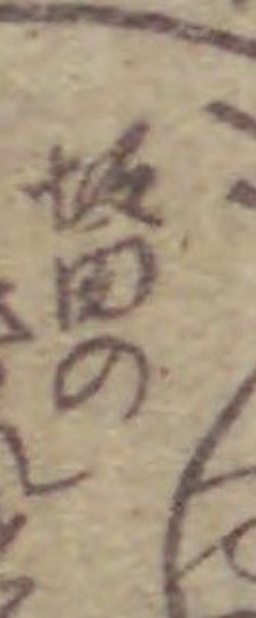坂田の
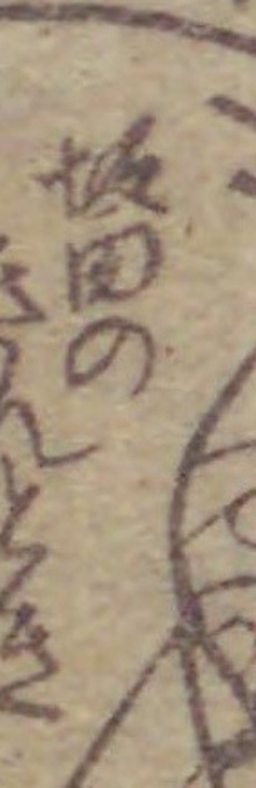坂田の
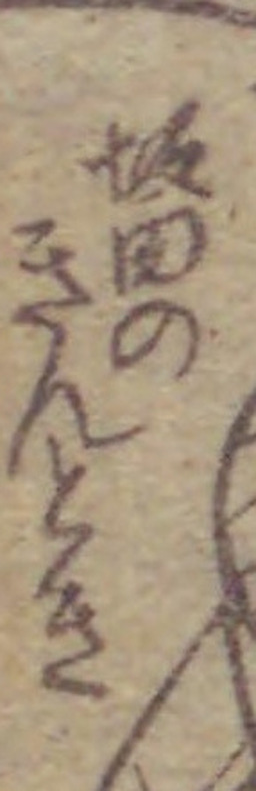きんとき

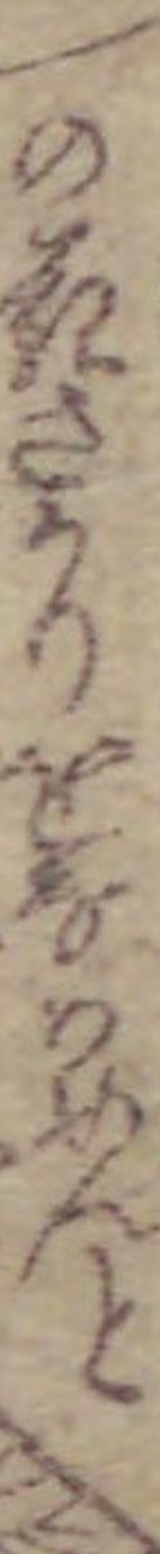の花さかりをなかめんと
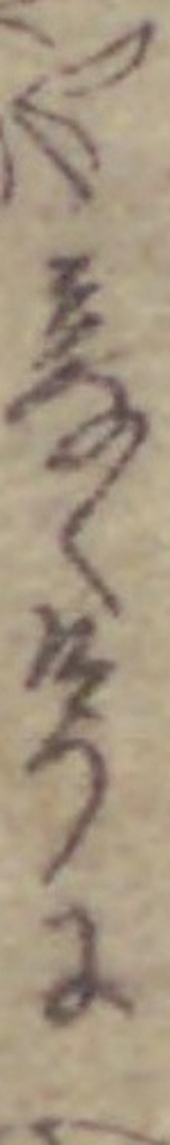みな〳〵けうに
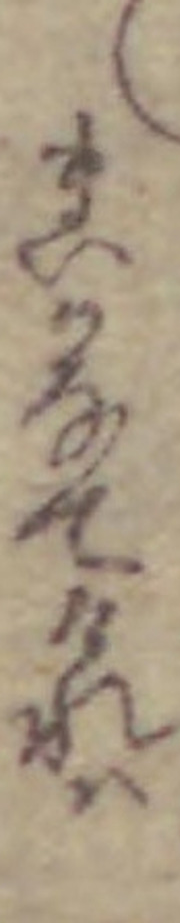まいかなてけれは
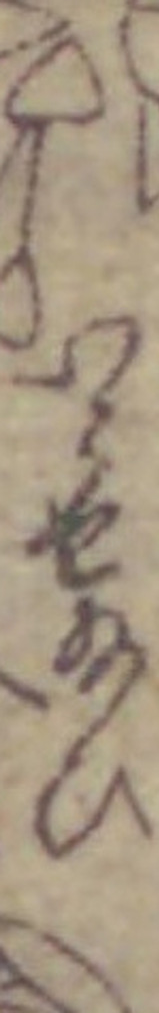いらせ給ひ
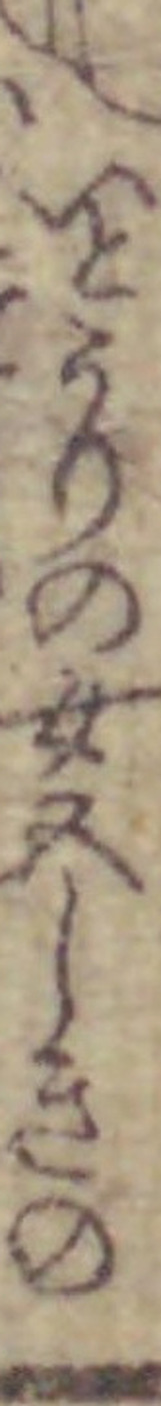いとうりの女五しきの
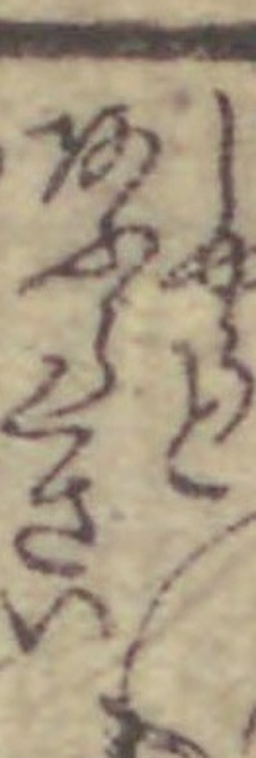あふらくさい
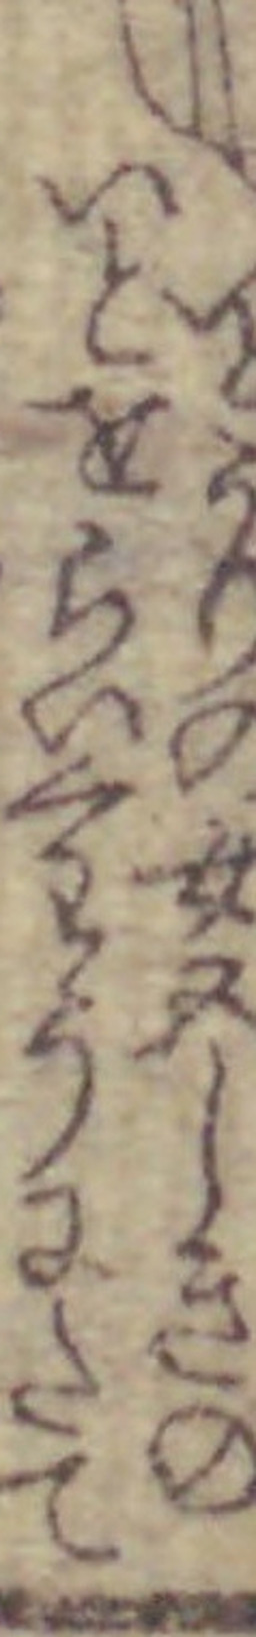いとをらいくわうにたて
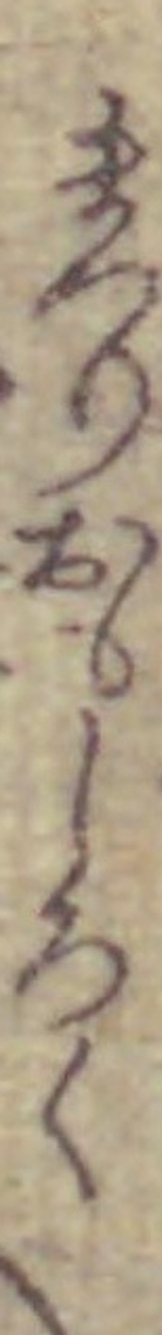まつりおもしろく
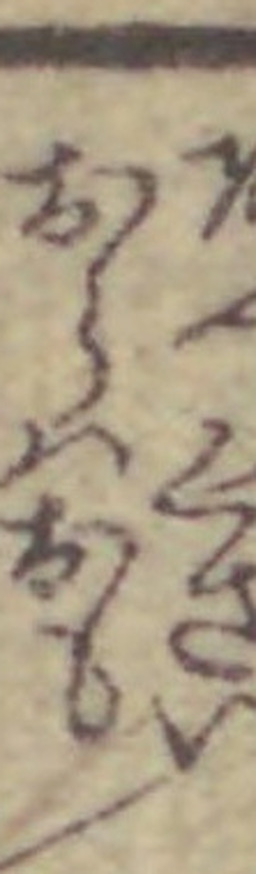おらはおも
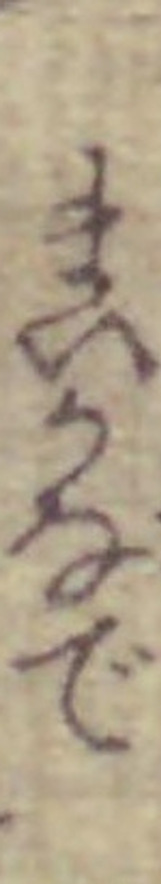まいかなで
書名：とんだ茶釜 2巻
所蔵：国立国会図書館 National Diet Library, JAPAN
